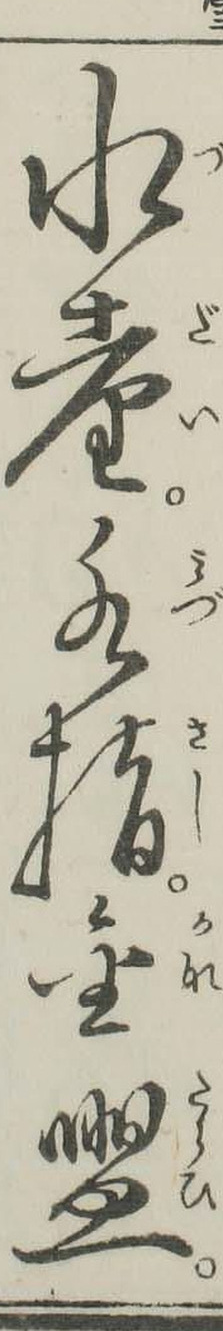水台。水指。金盥。
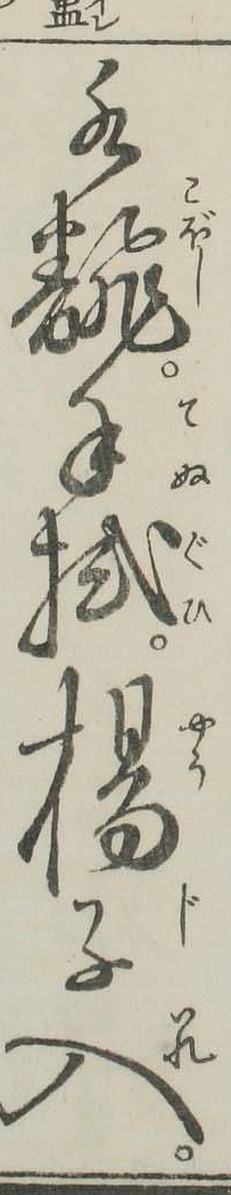水翻。手拭。楊子入。
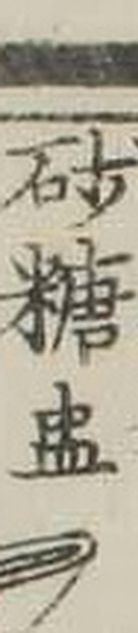砂糖盅
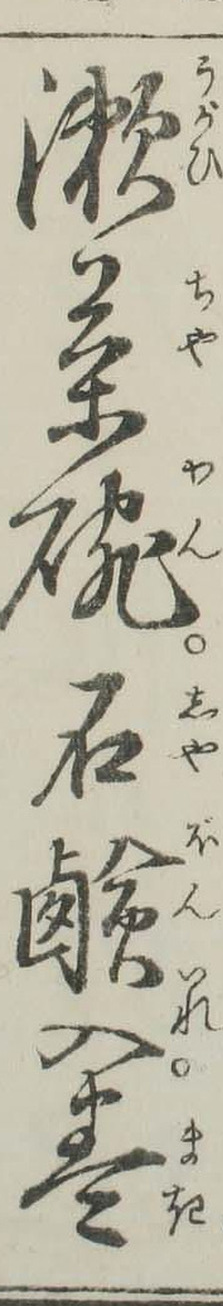漱茶碗。石鹸入。巻
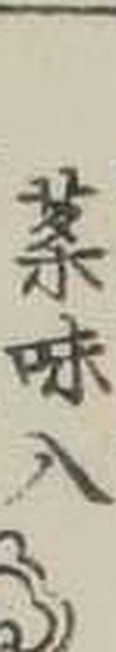薬味入
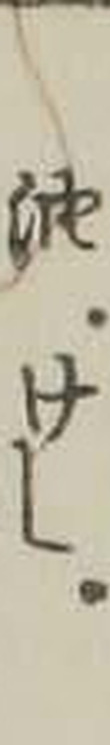油。けし。
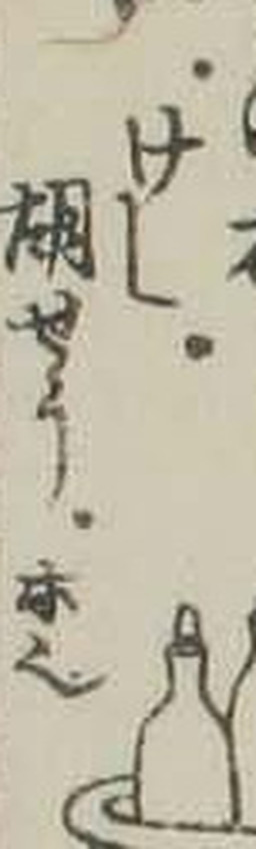胡せう。等也
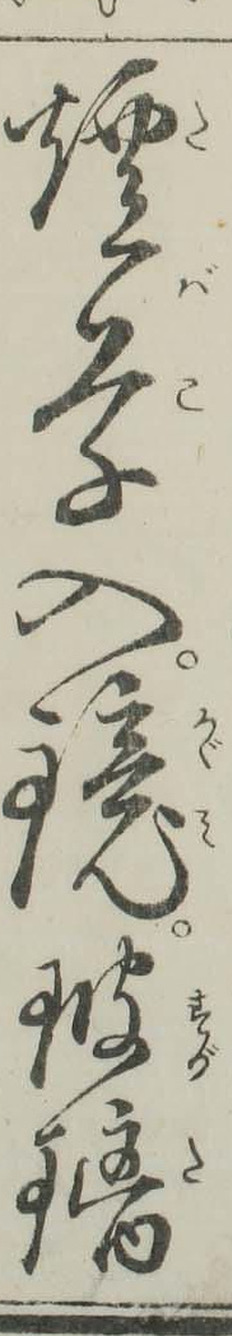煙草入。鏡。玻璃

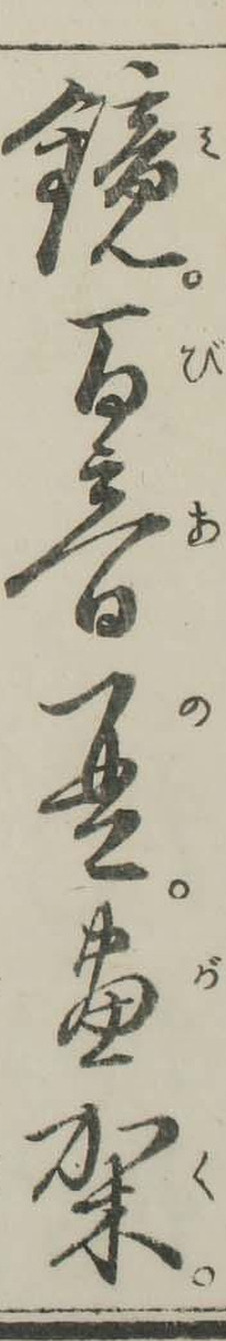鏡。百音琴。画架。
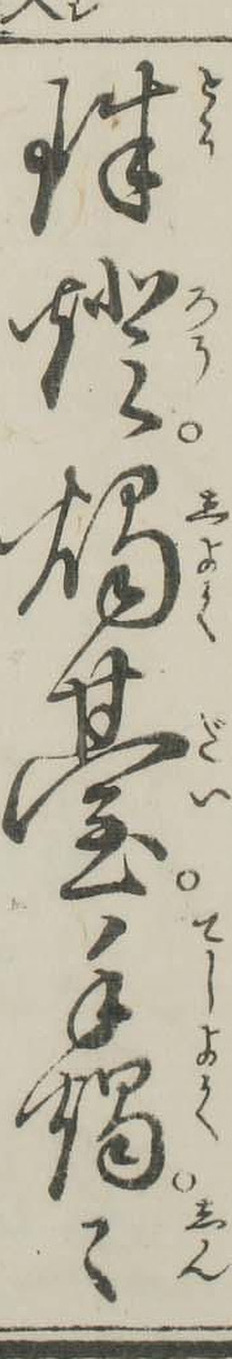珠燈。燭台。手燭。々
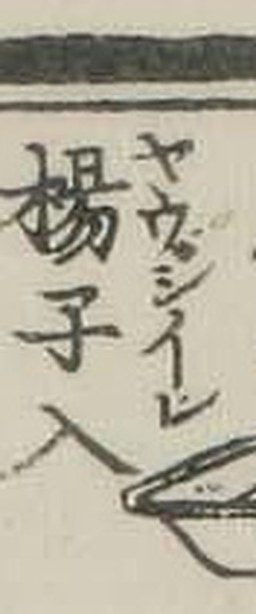楊子入
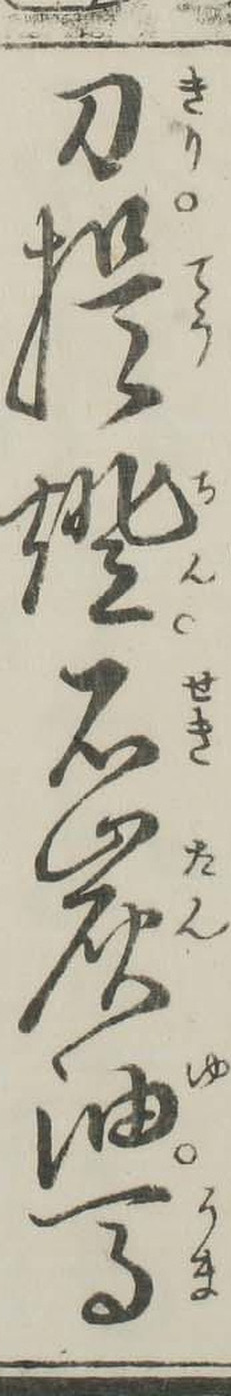刀。提燈。石炭油。馬
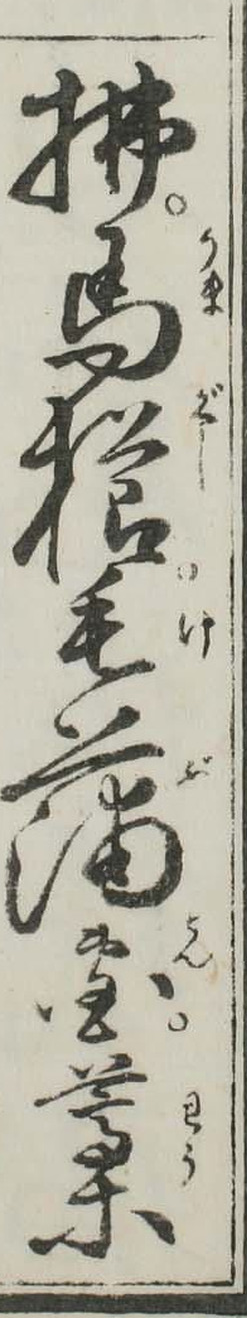払。馬櫛。毛蒲団。藁
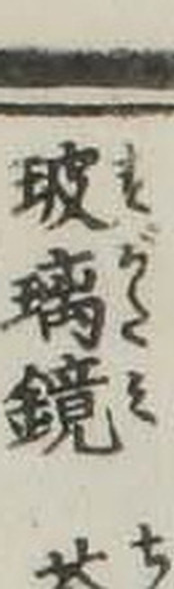玻璃鏡
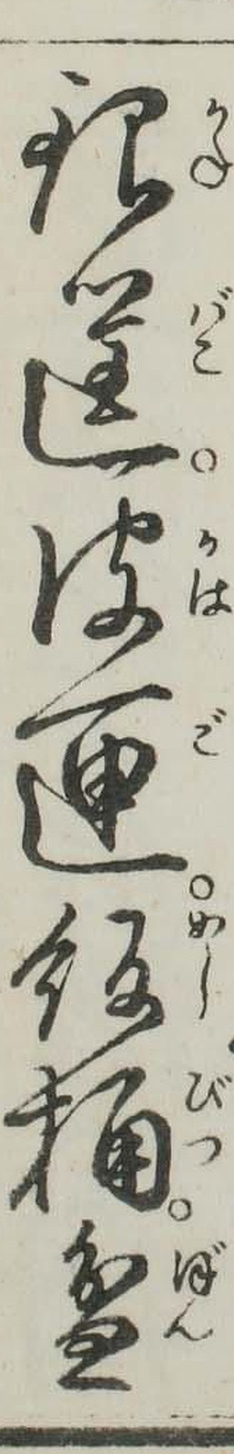銀筐。皮匣。飯桶。盆

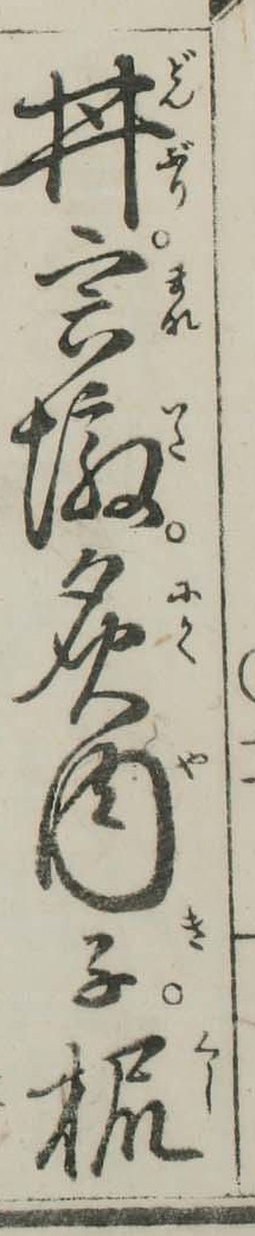丼。宍墩。炙肉子。梳
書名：開化往来
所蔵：東京学芸大学教育コンテンツアーカイブ
